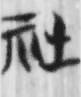社
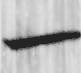一
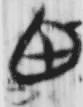甶（思）
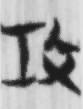攻
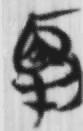解
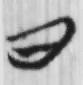日
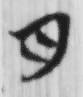月
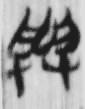與
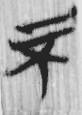不
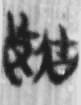○（辜）
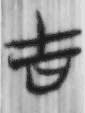吉
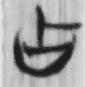占
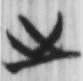之
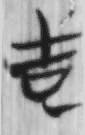吉
